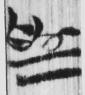爲
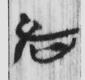左
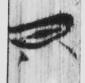尹
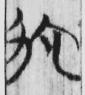{力它}
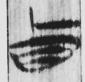貞
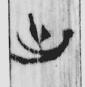出
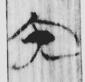內（入）
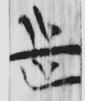寺（侍）
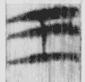王
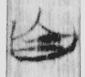自
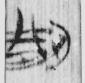○（荆）
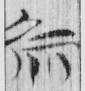𫵖
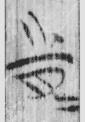之月
